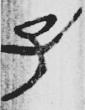子
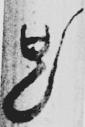也
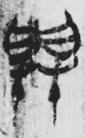與
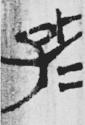孔子
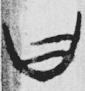曰
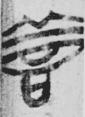善
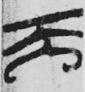而（爾）
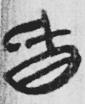昏（問）
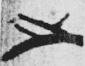之
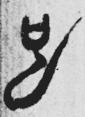也
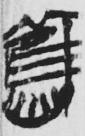舊（久）
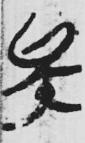矣
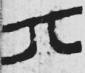亓（其）
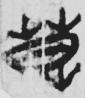莫
